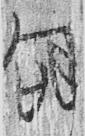含（今）
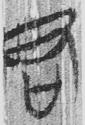君
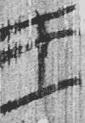王
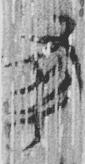○（盡）
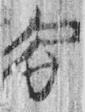去
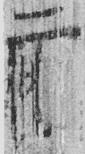耳
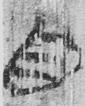目
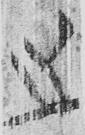之
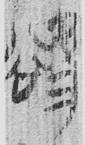欲
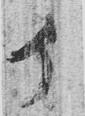人
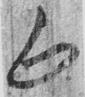㠯（以）
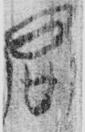君
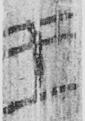王
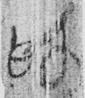爲
